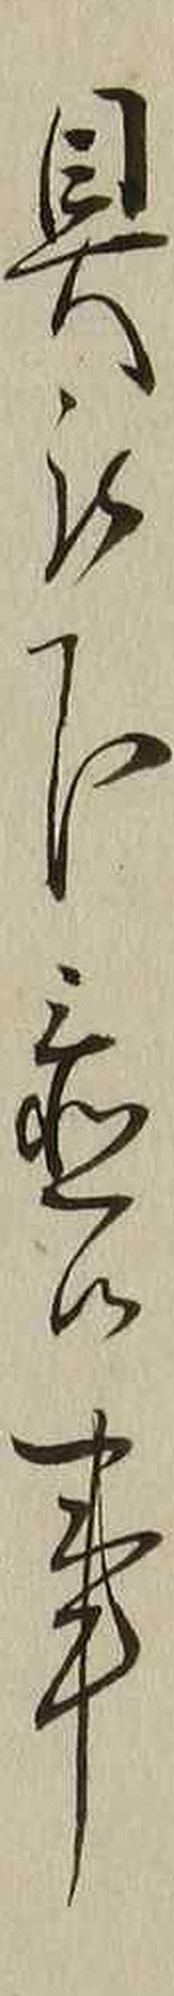具被下置候事
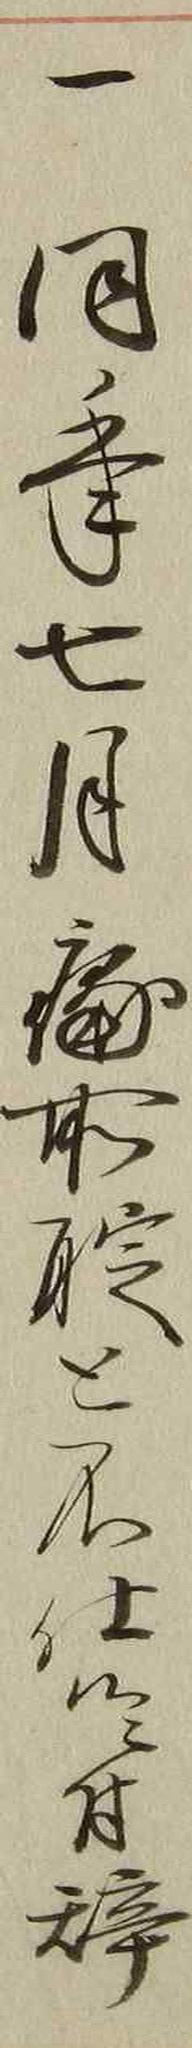一同年七月痛所聢と不仕候に付辞
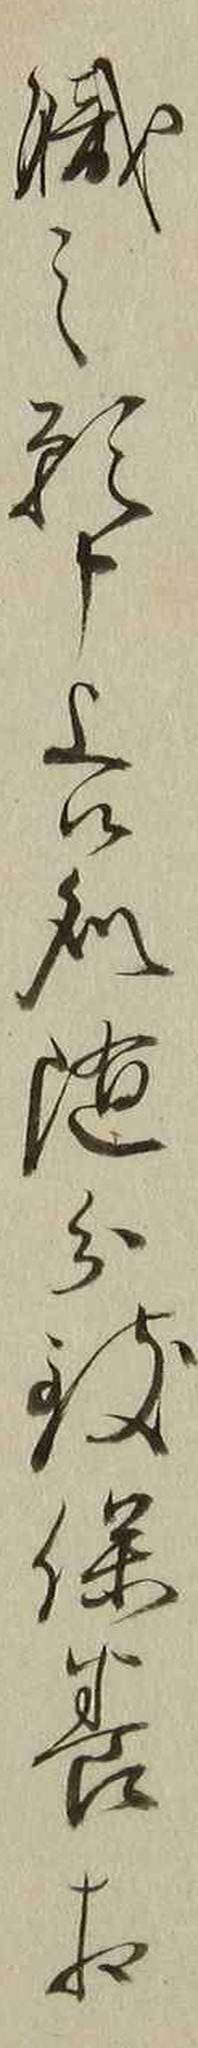職之願申上候処随分致保養相
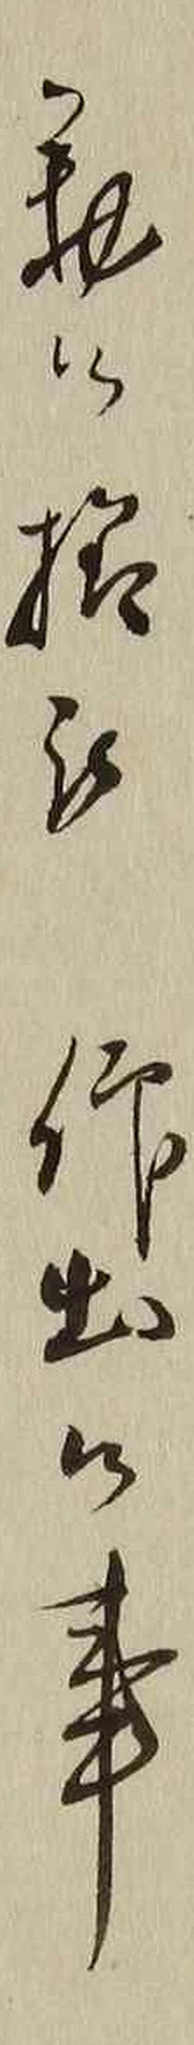勤候様被仰出候事
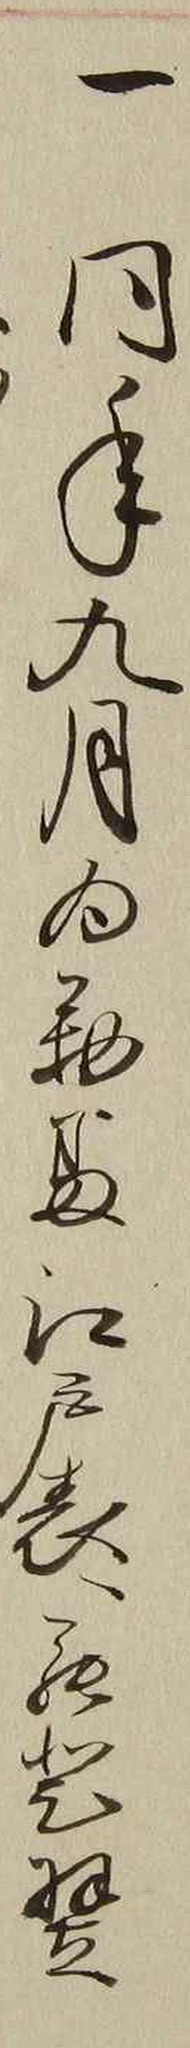一同年九月為勤番江戸表へ罷登翌
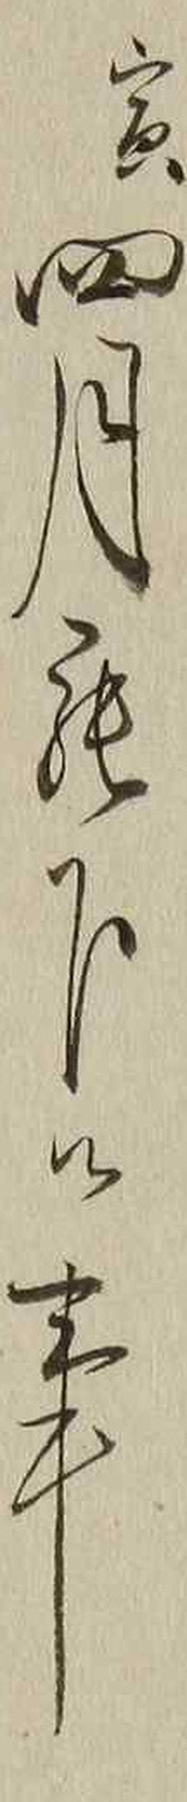寅四月罷下候事
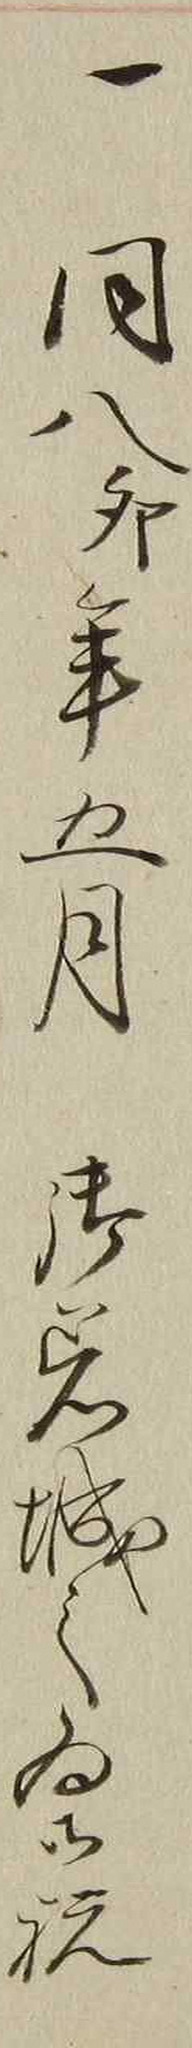一同八卯年五月御着城之為御祝
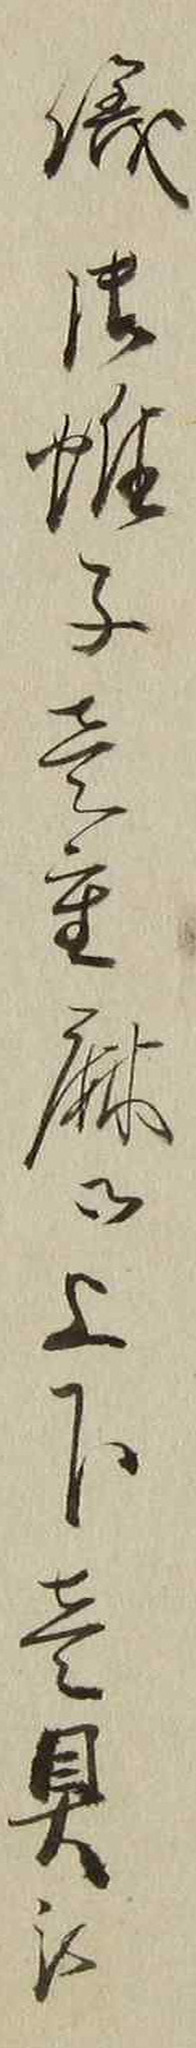儀御帷子壱重麻御上下壱具被
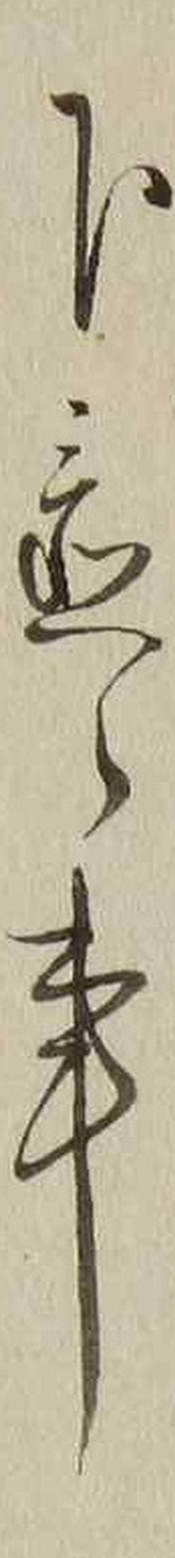下置候事
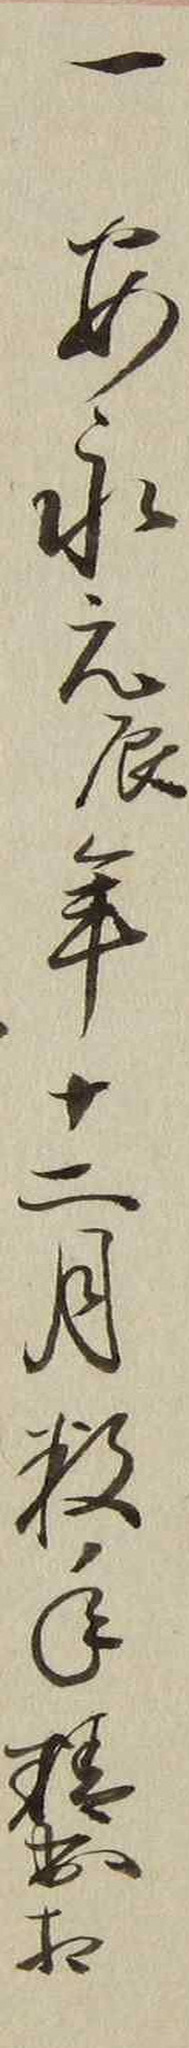一安永元辰年十二月数年精出相
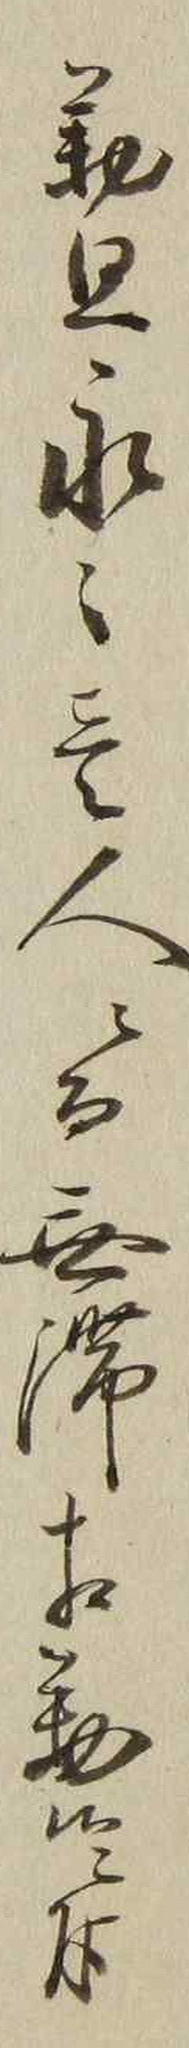勤且永々壱人に而無滞相勤候に付
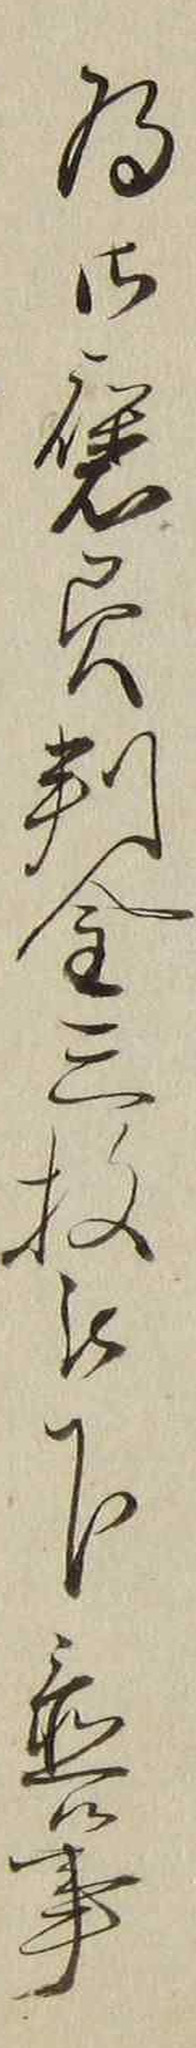為御褒美判金三枚被下置候事
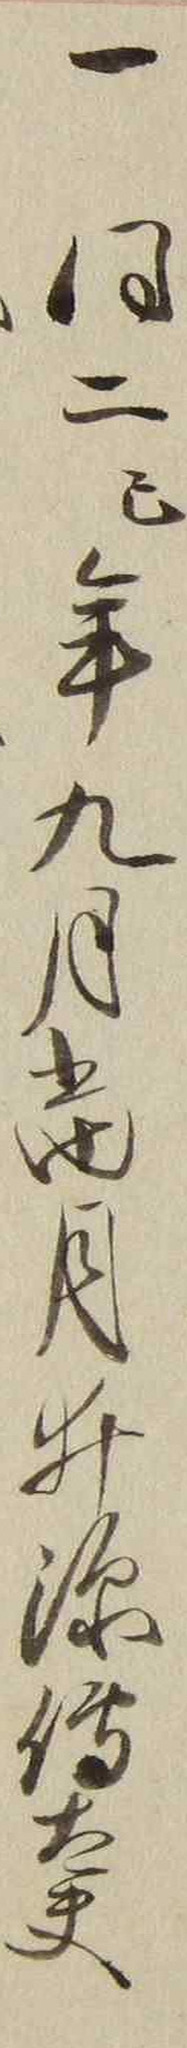一同二巳年九月当月升深伝太夫
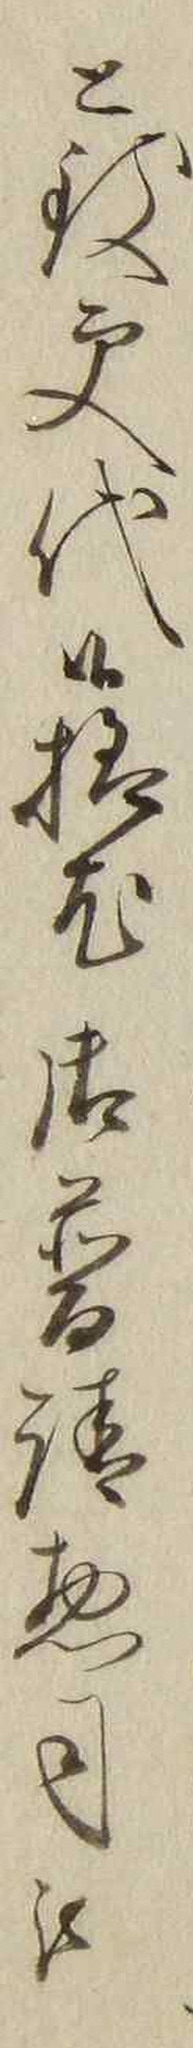と致更代候様尤御普請惣司被

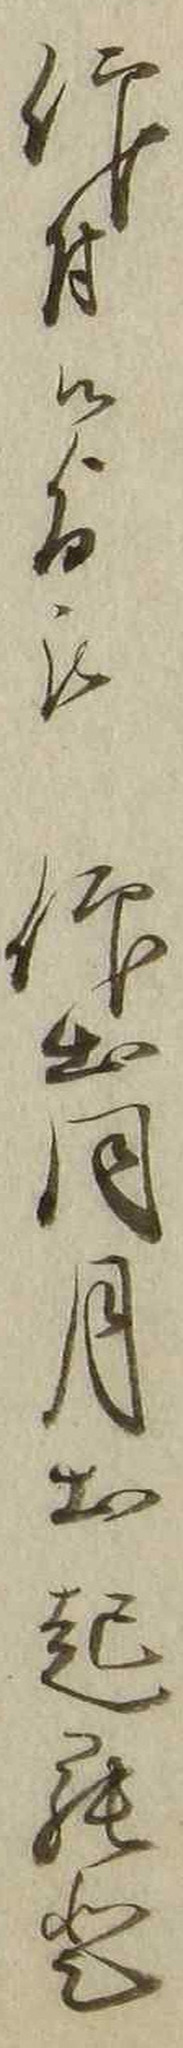仰付候旨被仰出同月出起罷登
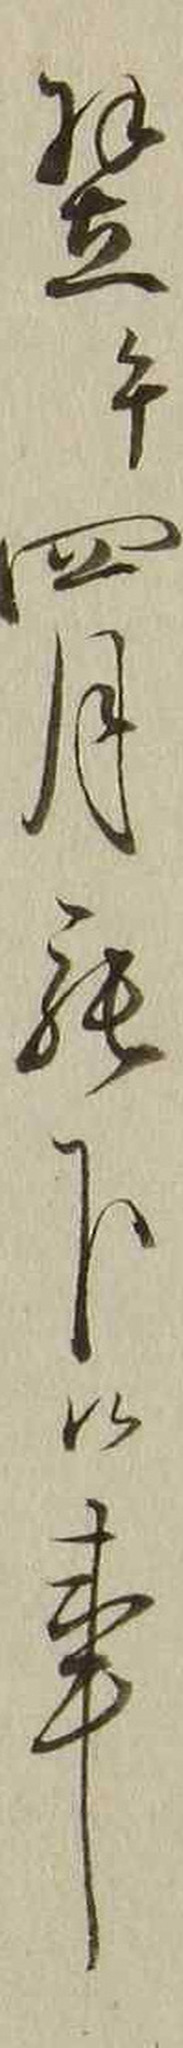翌午四月罷下候事
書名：諸士系譜　巻之103　か之部11
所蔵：会津若松市立会津図書館
